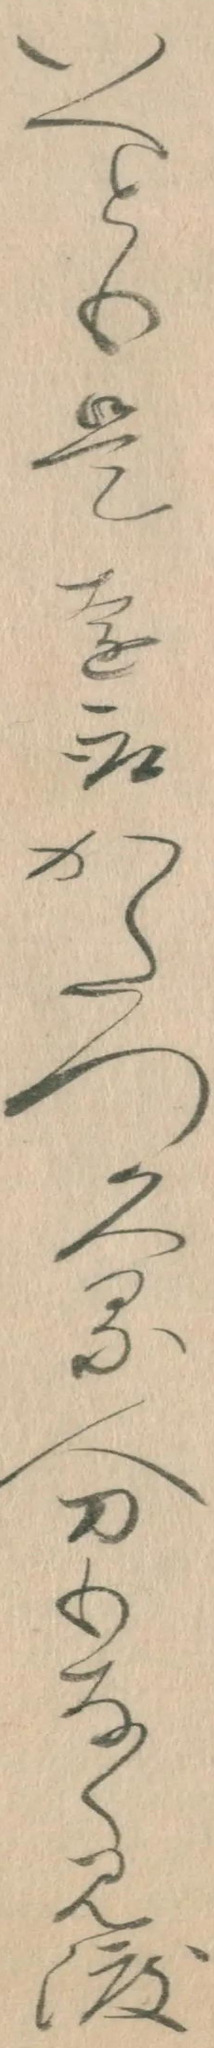いへとも是を取かたつくる人力もなく見渡
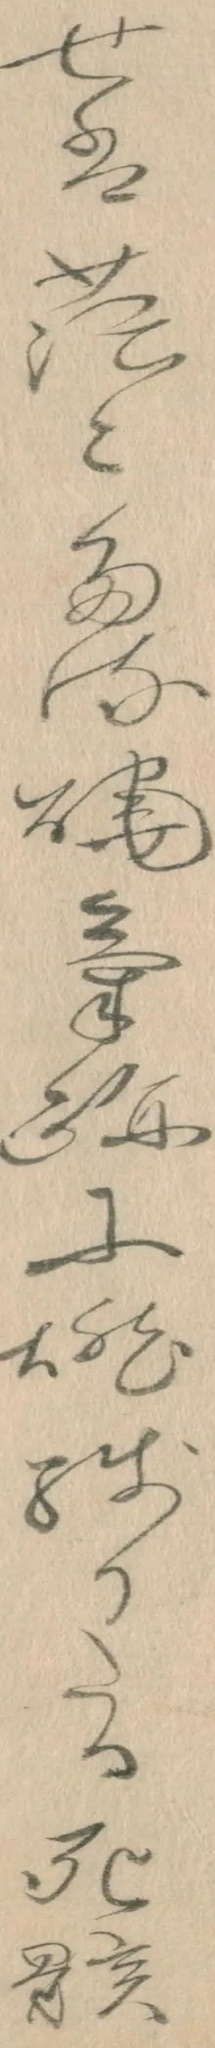せは茫々たる焼け跡に燃残りたる死骸

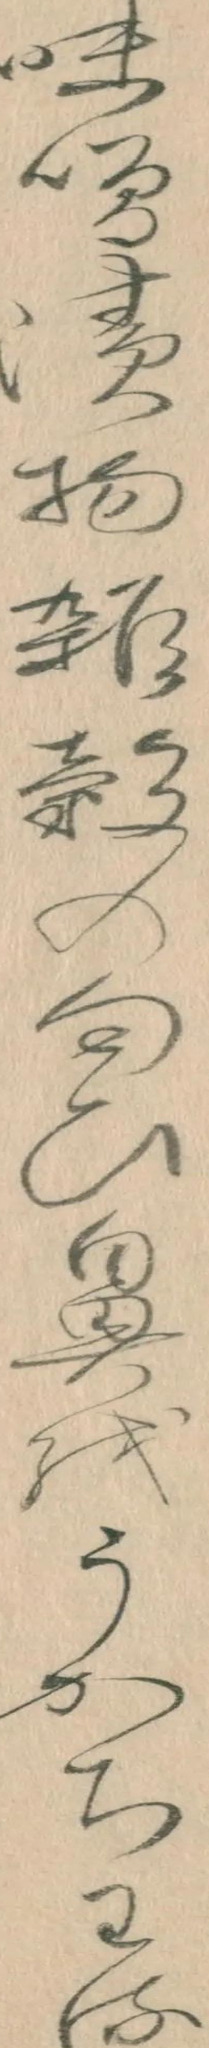味噌漬物雑穀の匂ひ鼻をうかちわる
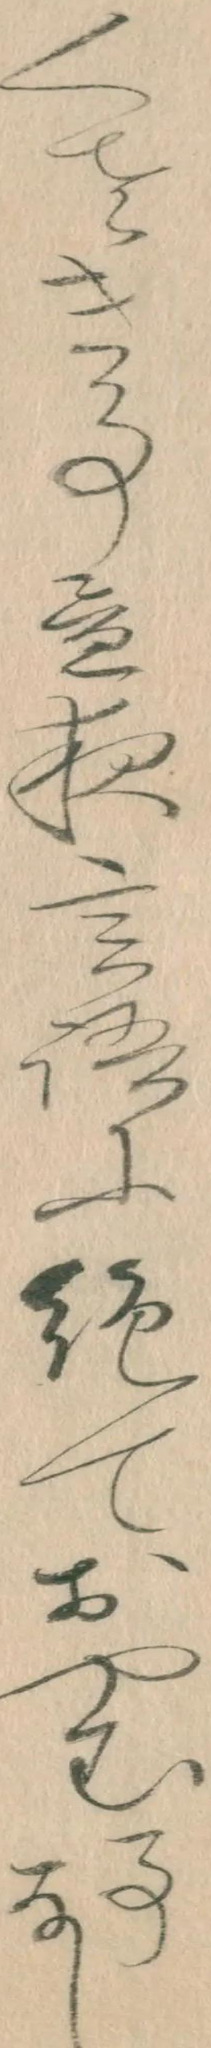くさき事昼夜言語に絶ておやむ事なし
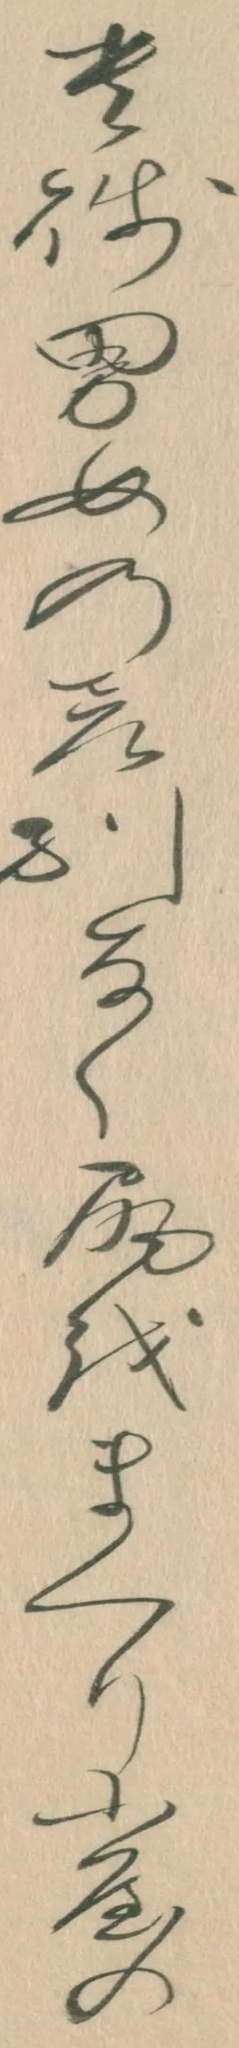貴賤男女の差別なく裙をまくり小屋の
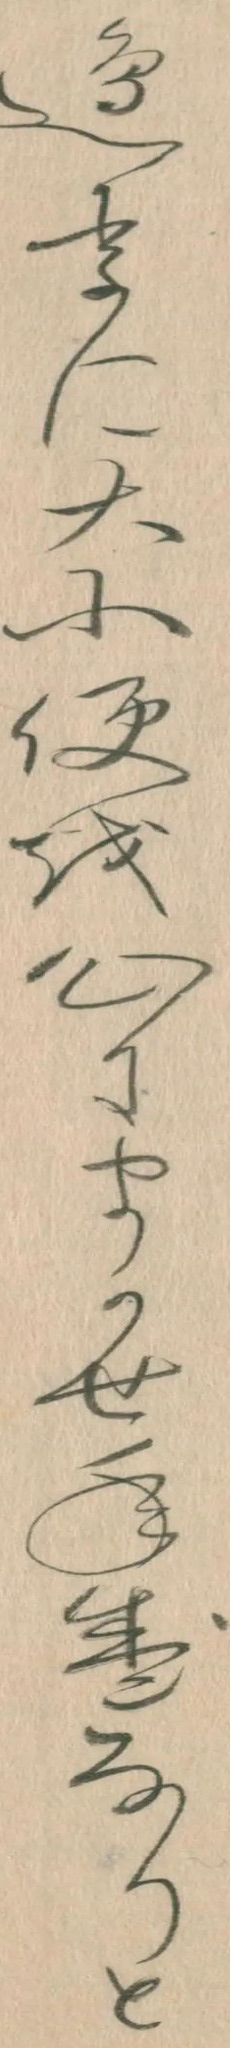辺りに大小便を心にまかせ年盛なりと
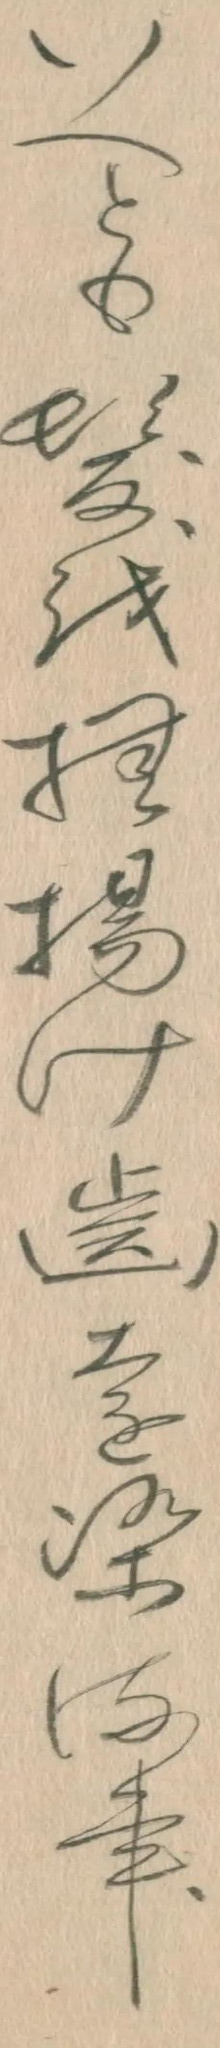いへとも髪を撫揚け歯を染る事
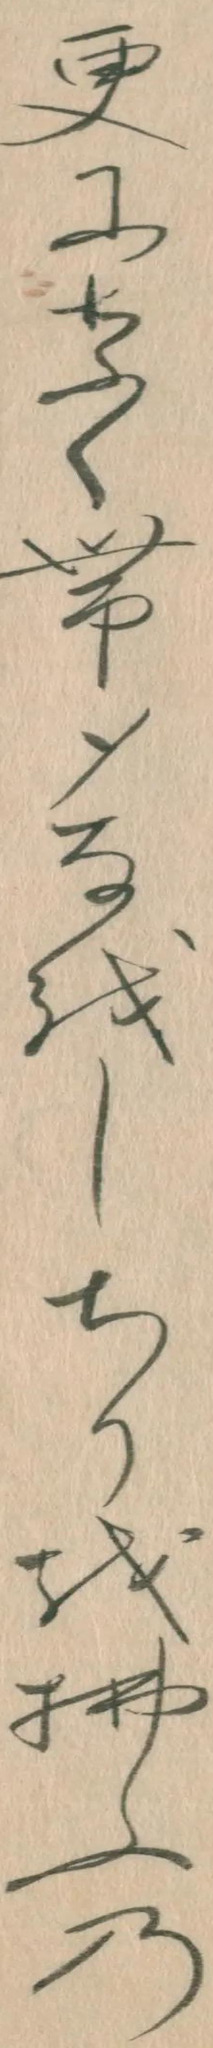更になく帯〆なをしちりを払ふの
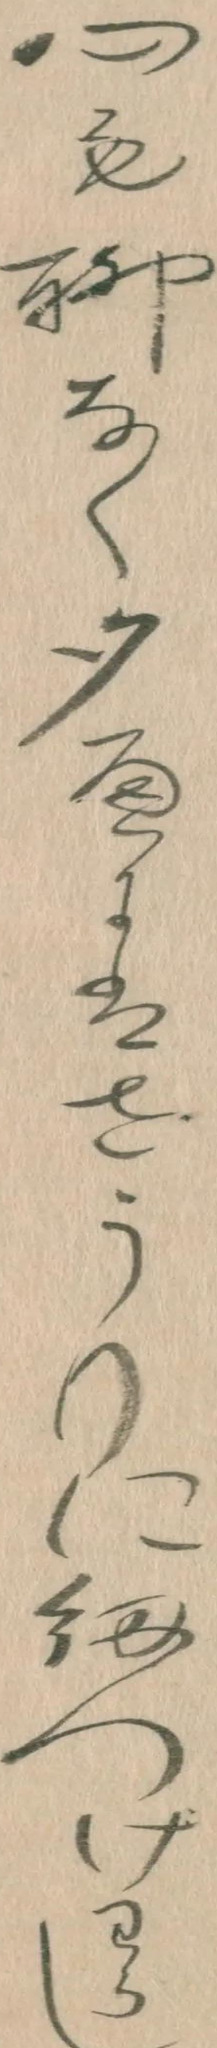心も聊なく夕へにはさうりに紐つけわらし
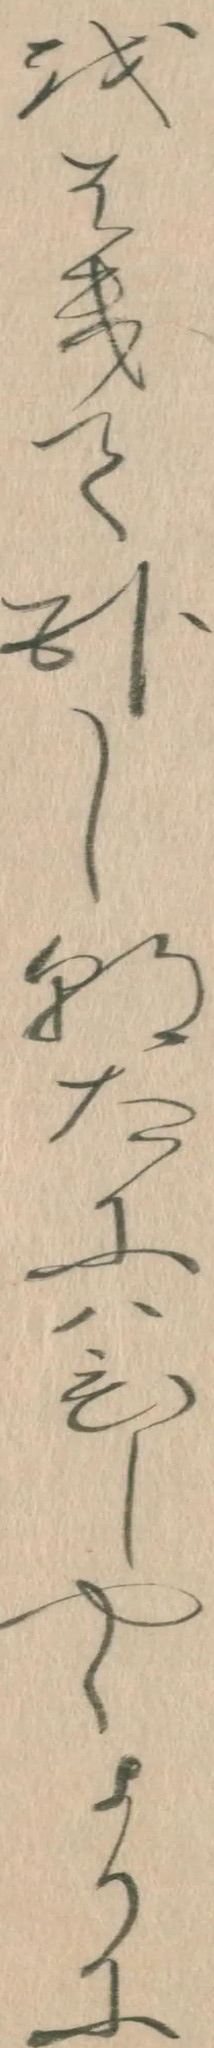をはきて臥し朝たにはひしやくよりに
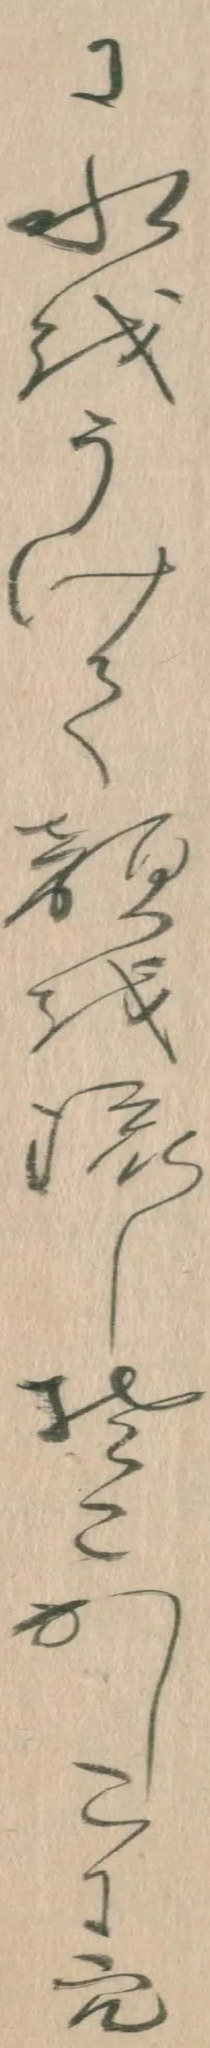に水をうけて顔を流しそこかしこに穴
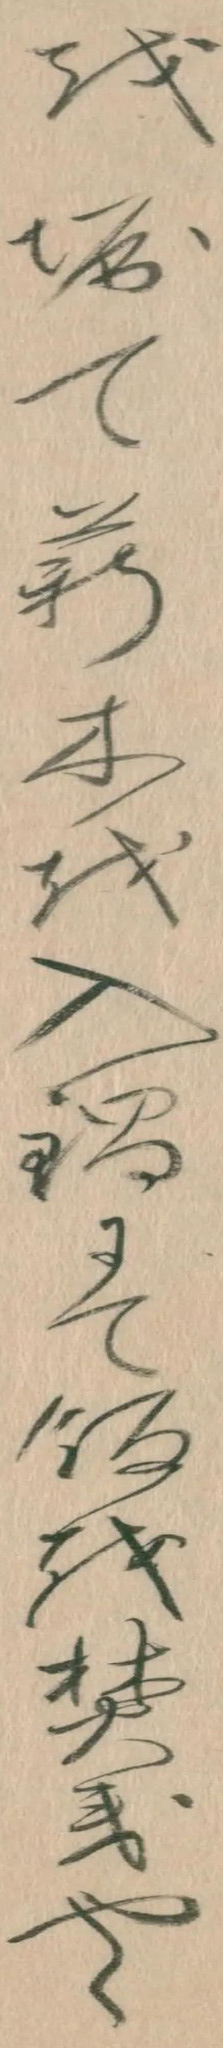を掘て薪木を入鍋にて飯を炊きやく
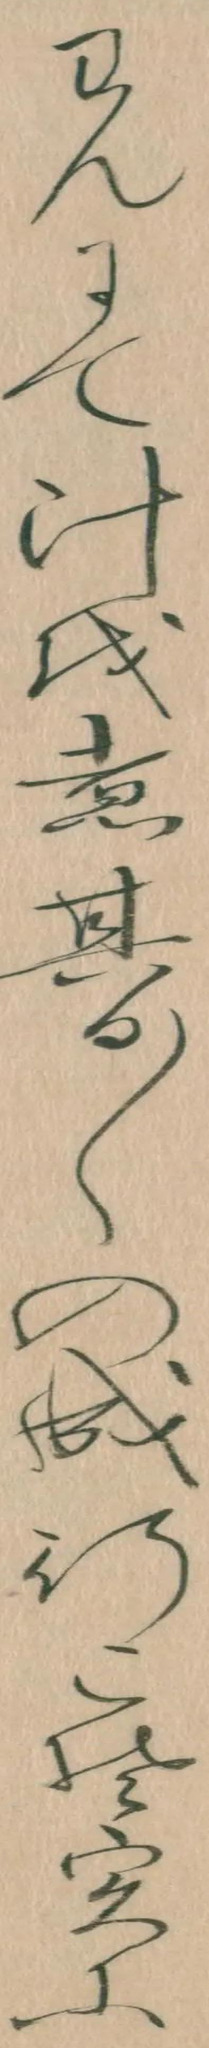わんにて汁を煮其日〳〵の成行こそ実に
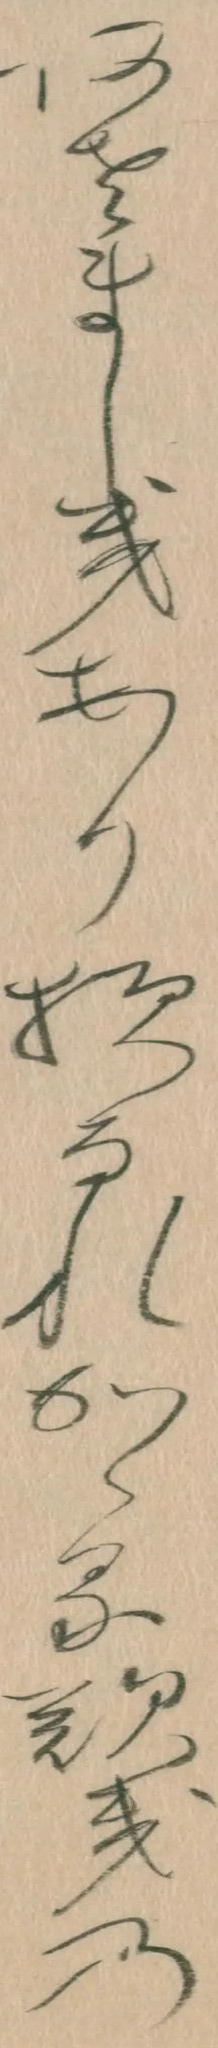あさましきあり様なれかゝる歎きの
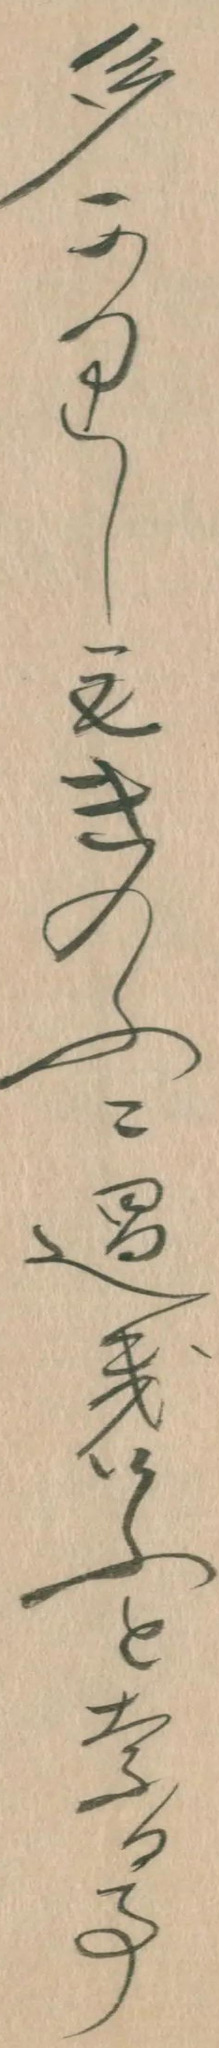多かりしもきのふに過きけふとなる事
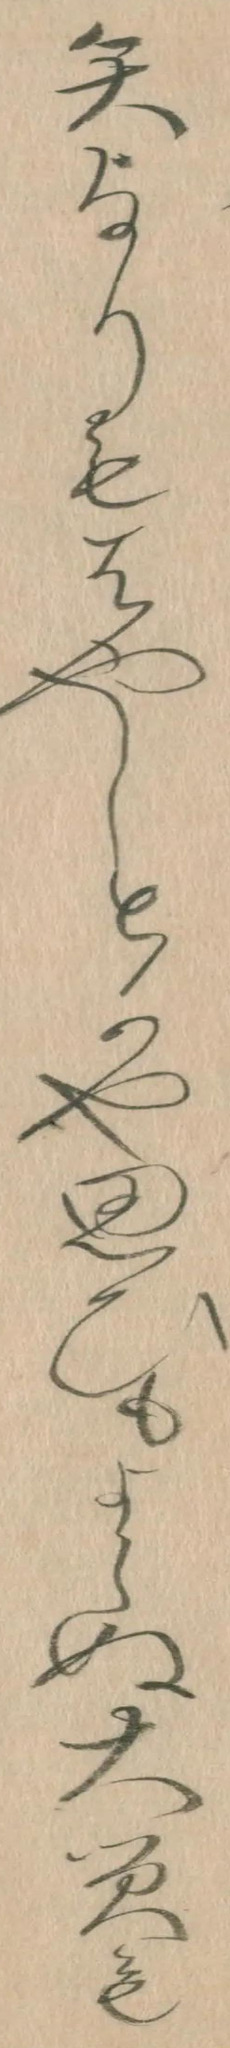矢よりもはやしとかや思ひもよらぬ大災も
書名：俗語之種. [5]
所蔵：国立国会図書館 National Diet Library, JAPAN
